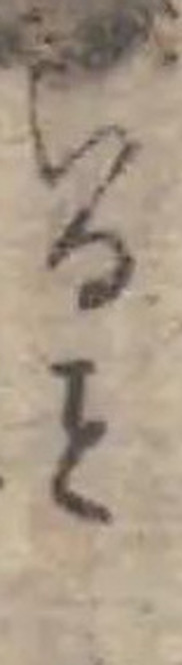いること
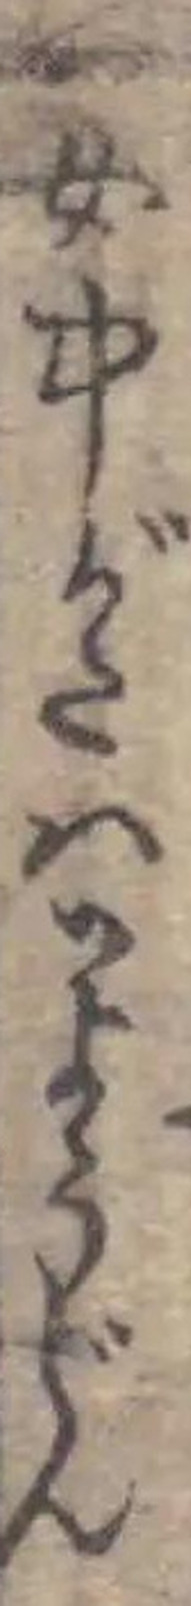女中がたは御ようじん
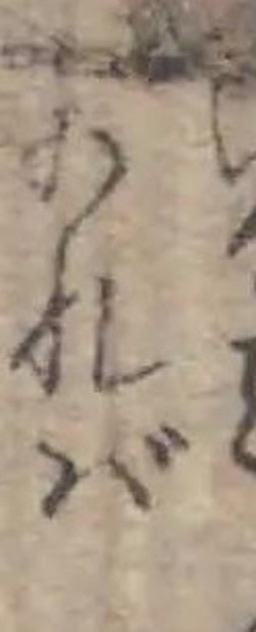あれば
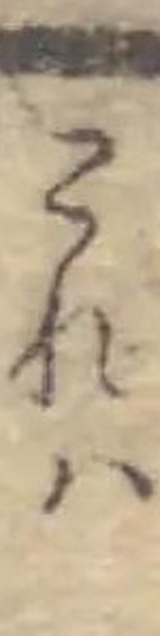これは
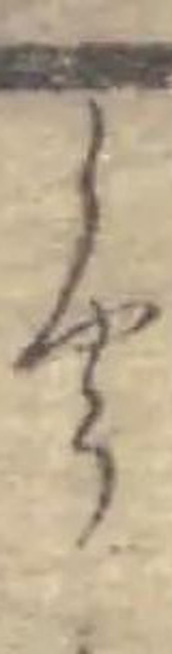しやう
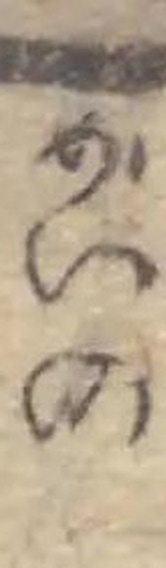めいの
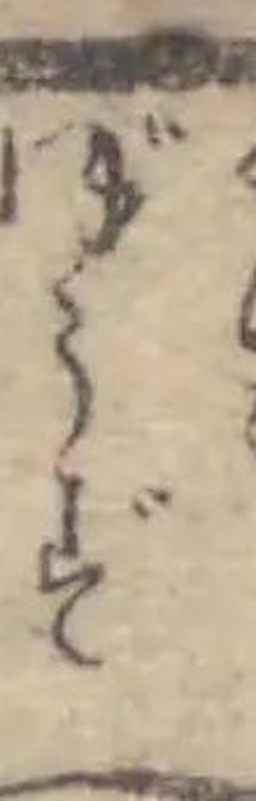ぼうず
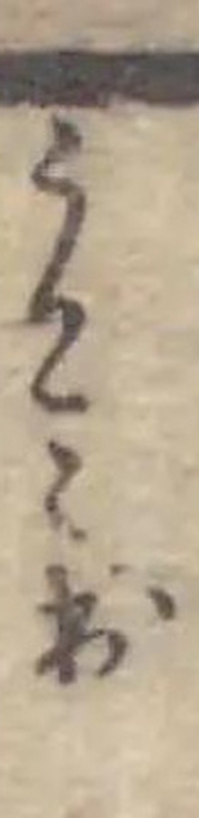うかみ出
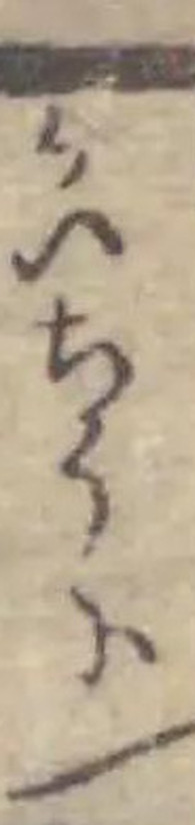かいちうに
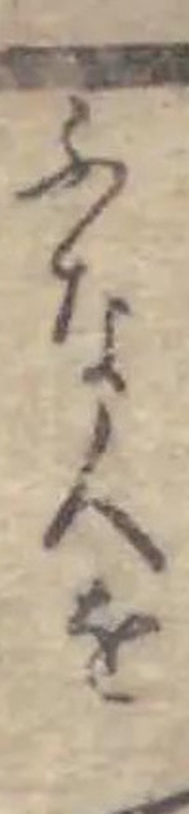ふな人を
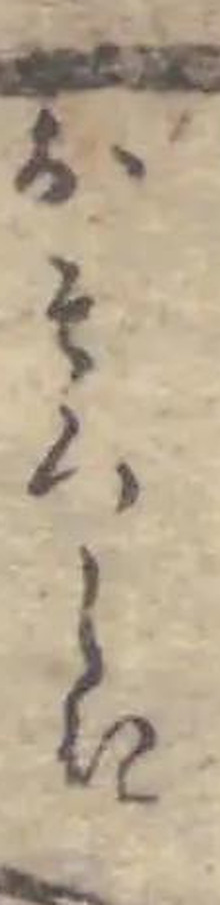おそろしき
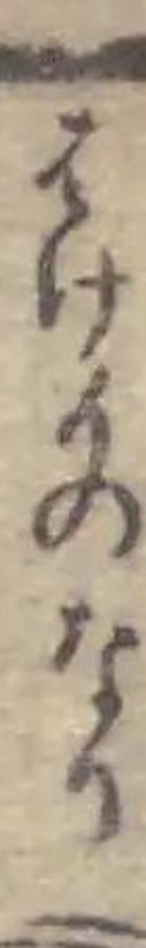はけものなり

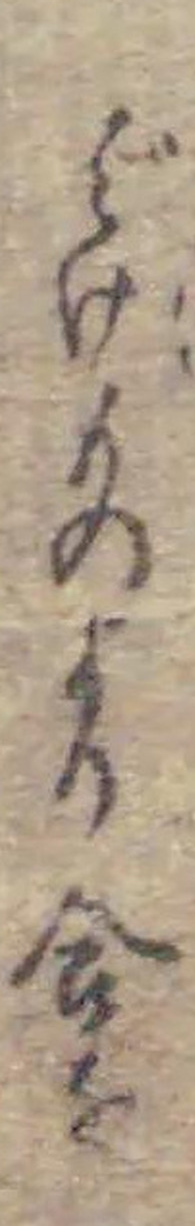ばけものより合を
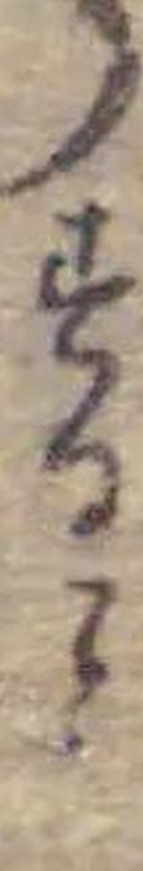すること
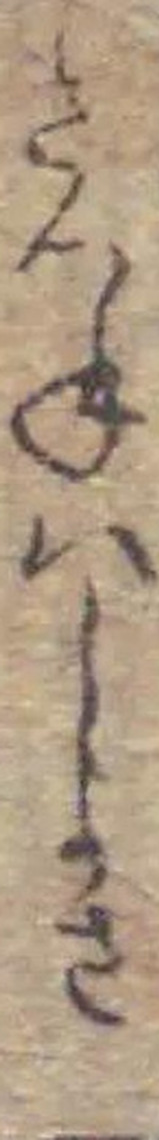きつねはしよさ
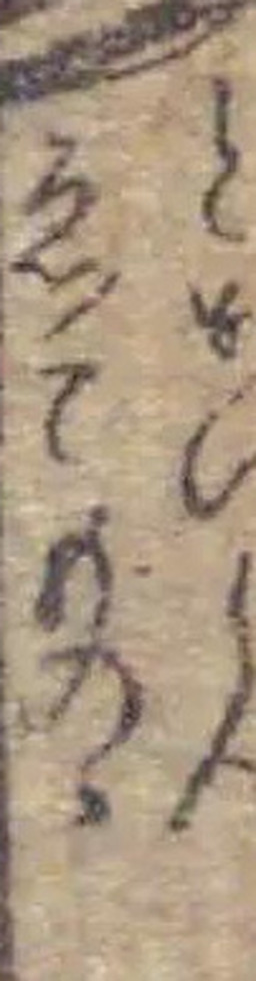えてものゝ
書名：夭怪着到牒 2巻
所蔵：国立国会図書館 National Diet Library, JAPAN
